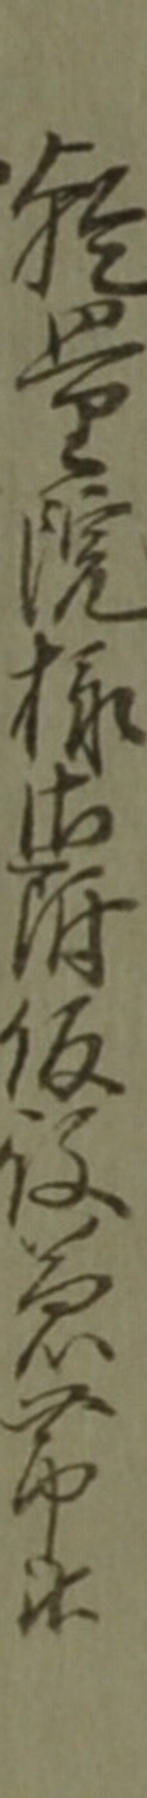乾量院様御附仮役兼帯被

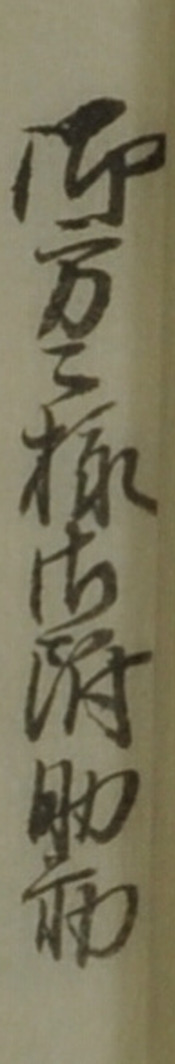御方々様御附助勤
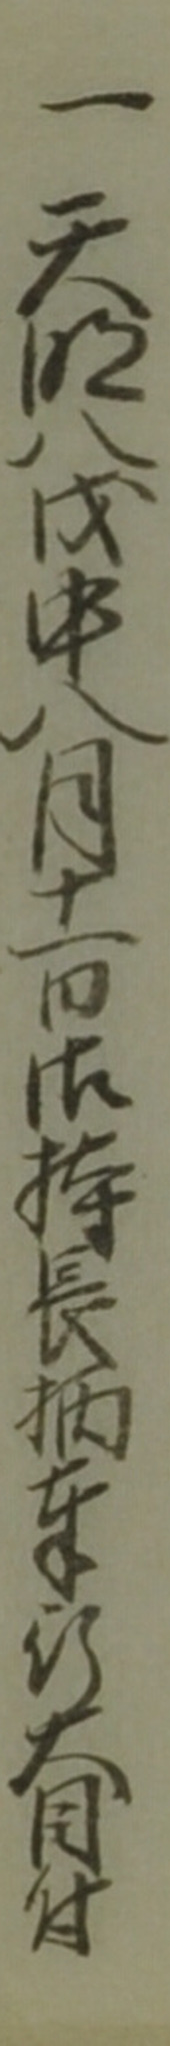一天明八戊申八月十一日御持長柄奉行大目付
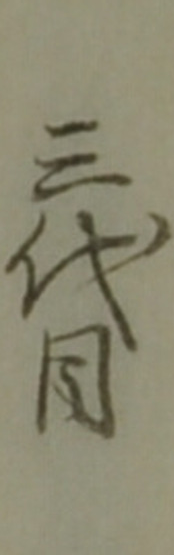三代目
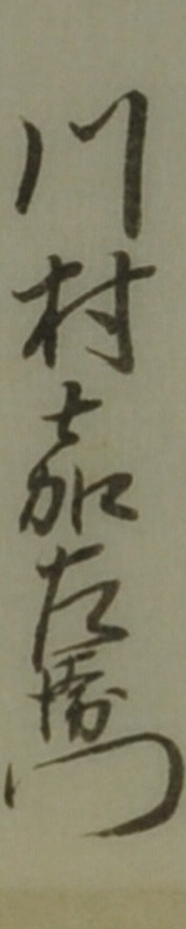川村嘉左衛門
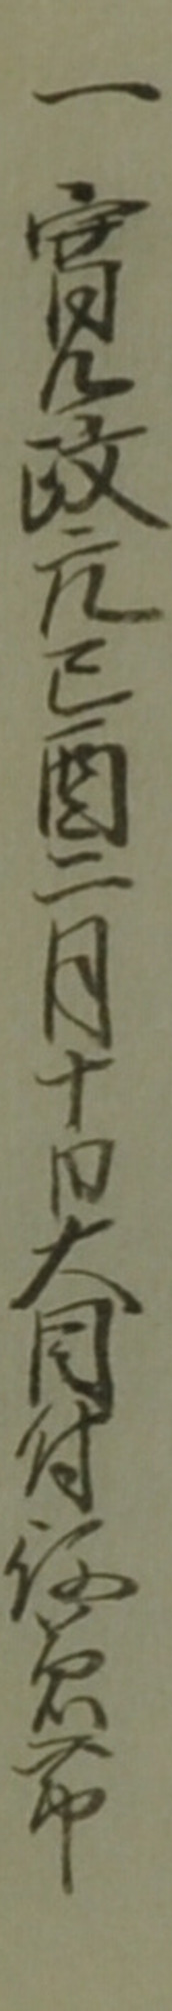一寛政元己酉二月十日大目付役兼帯
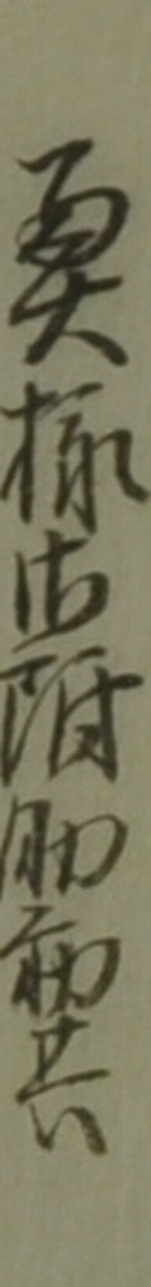奥様御附助勤共
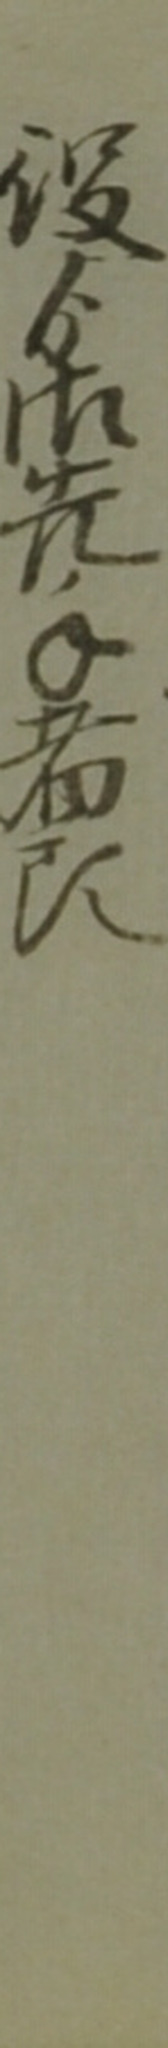役ゟ御先手者頭
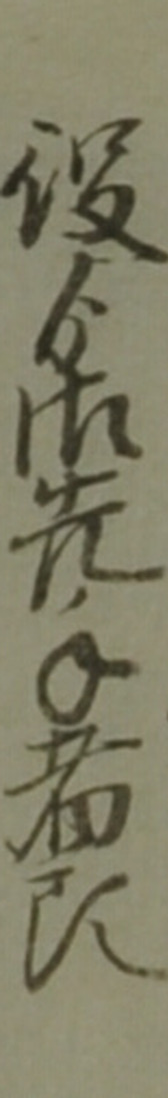役ゟ御先手者頭
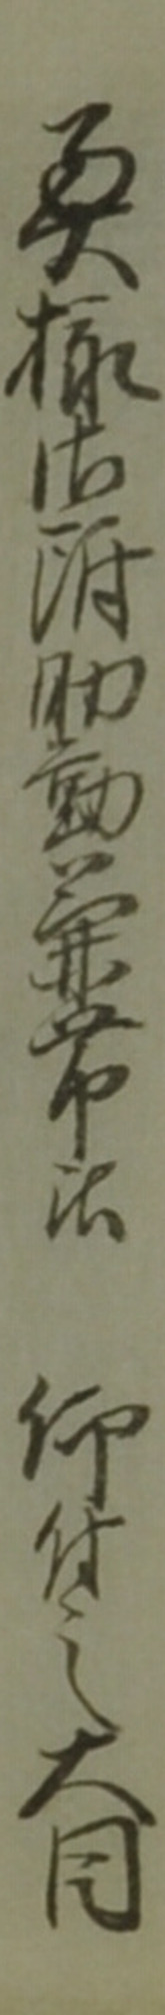奥様御附助勤兼帯被仰付之大目
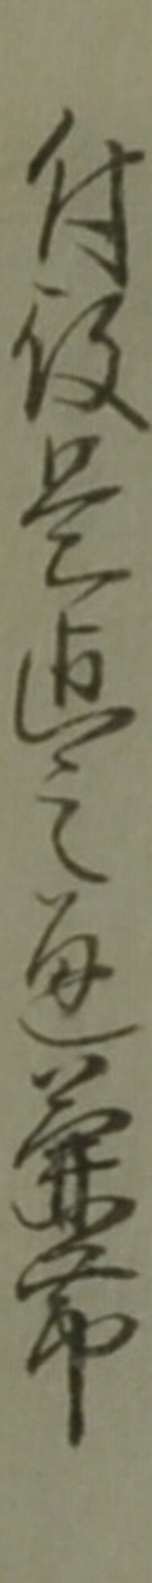付役是迄之通兼帯
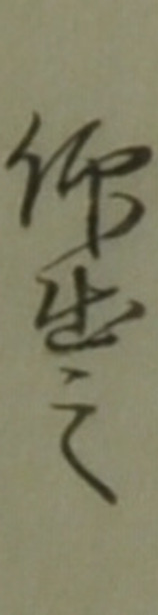仰出之
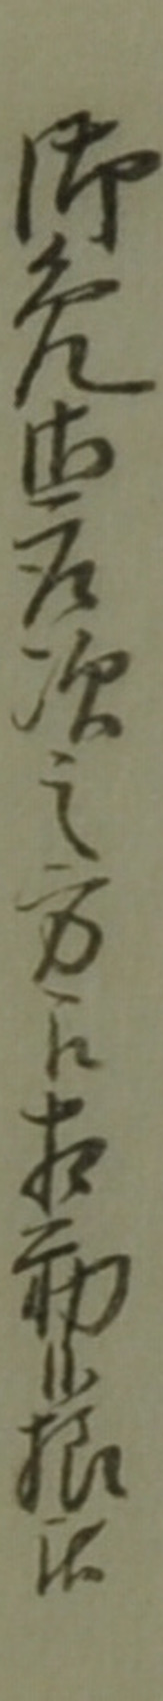御免御取次之方江相勤候様被
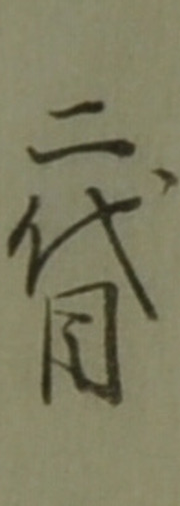二代目
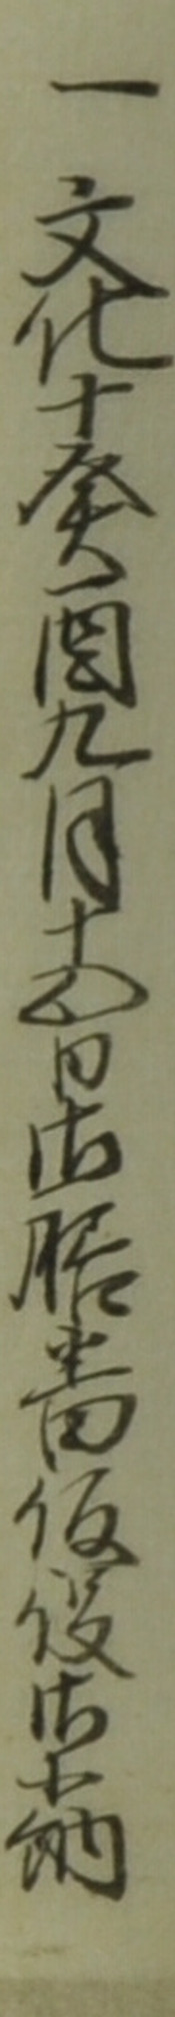一文化十癸酉九月十五日御膳番仮役御小納
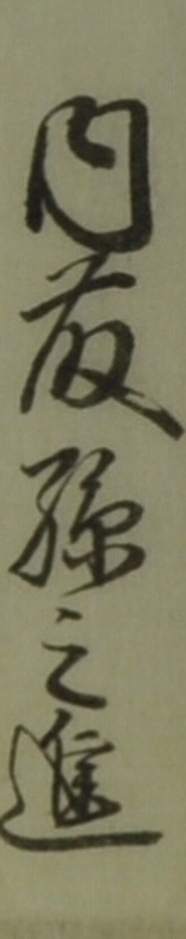内藤孫之進
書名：諸御役代々録（六）
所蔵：伊那市立高遠町図書館・合同会社AMANE
